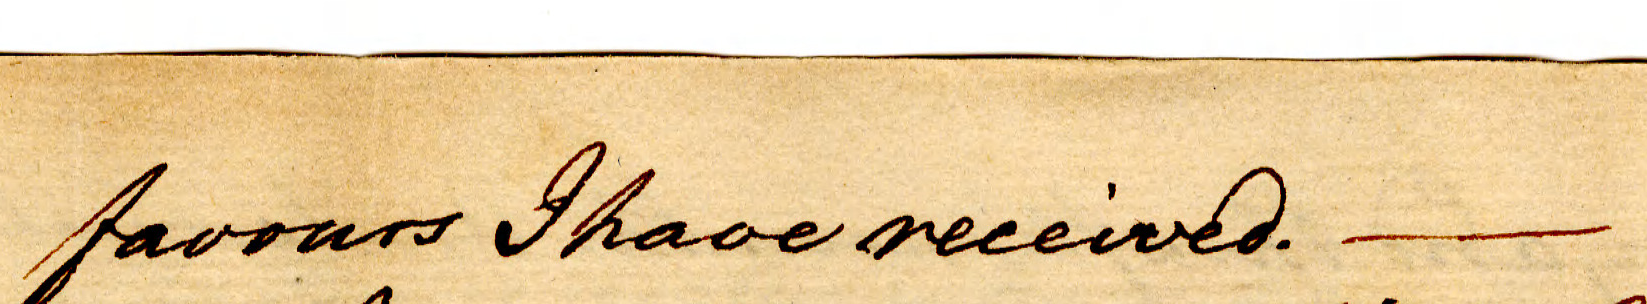favours I have received.-
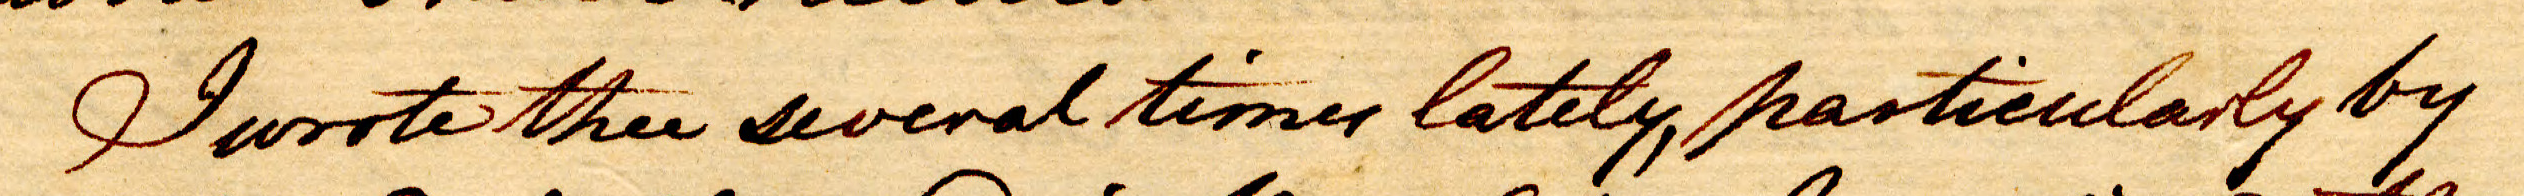I wrote thee several times lately, particularly by
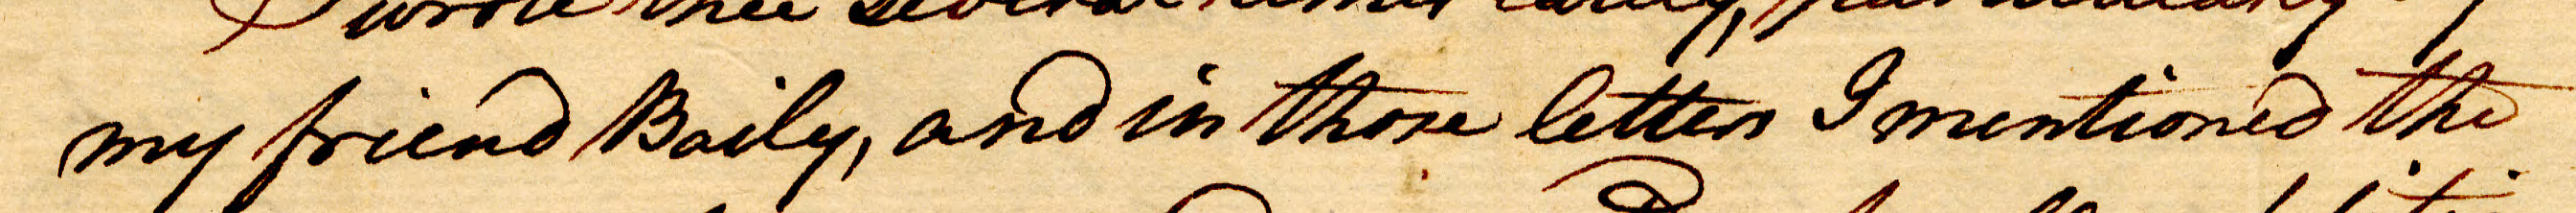my friend Baily, and in those letters I mentioned the
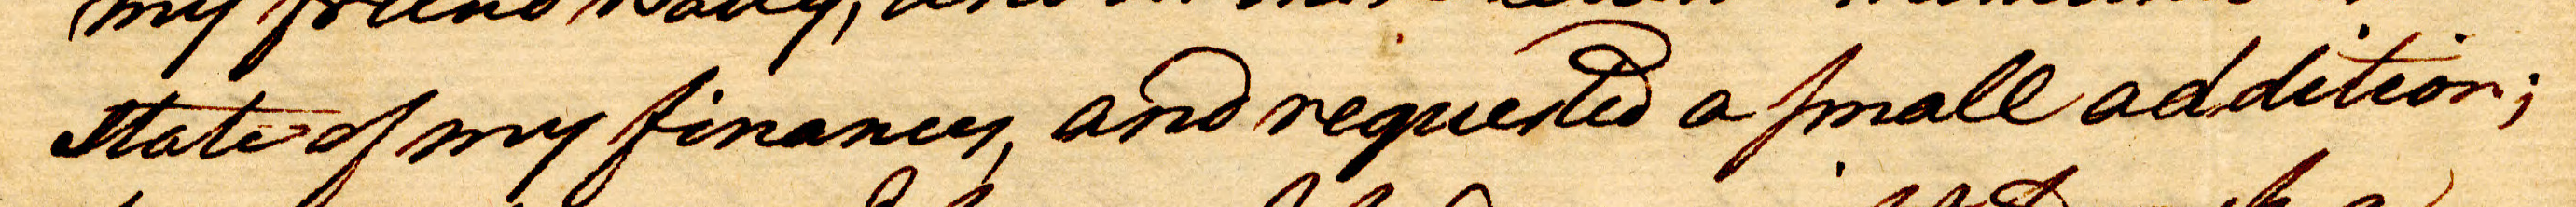state of my finances, and requested a small addition;
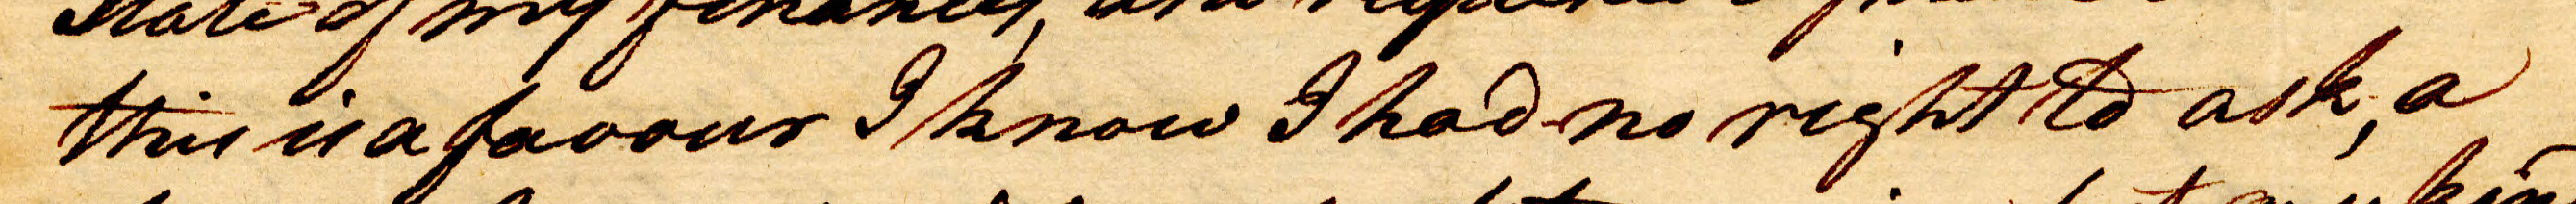this is a favour I know I had no right to ask, a
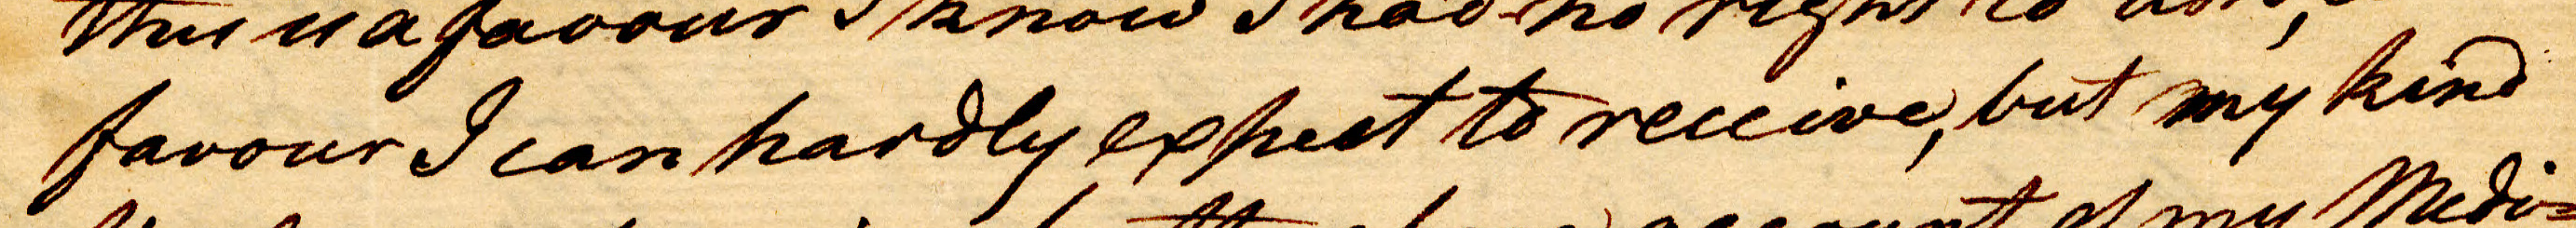favour I can hardly expect to receive, but my kind
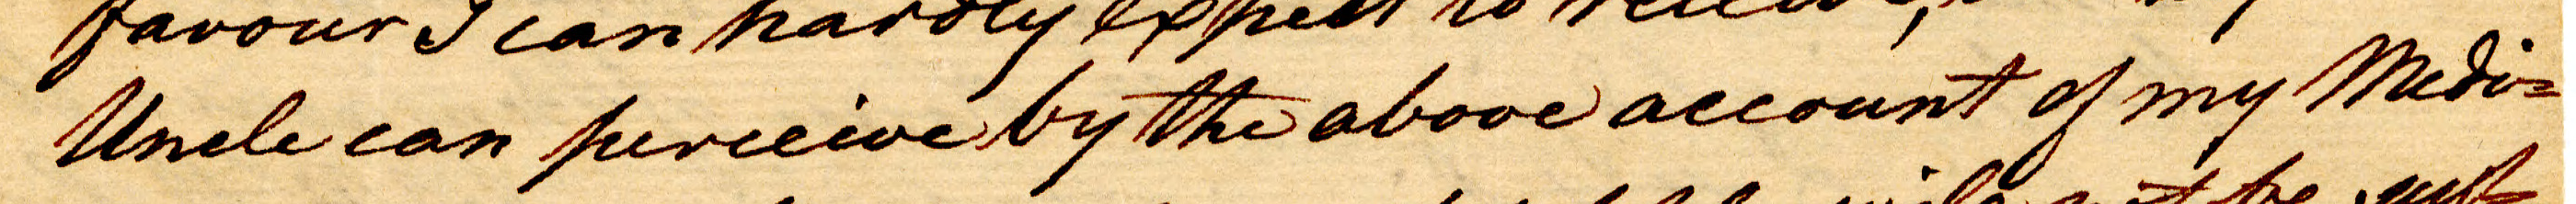Uncle can perceive by the above account of my Medi-
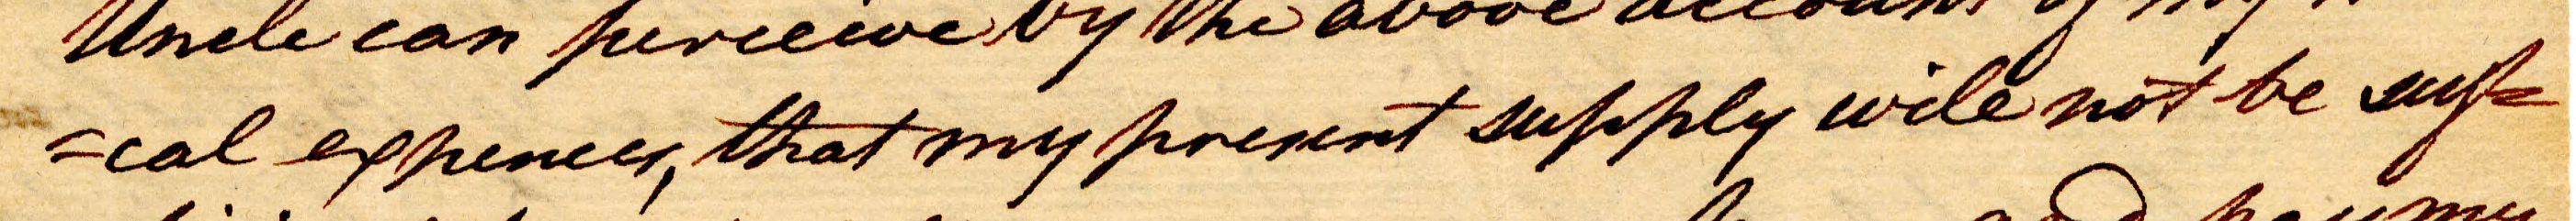-cal expences, that my present supply will not be suf-
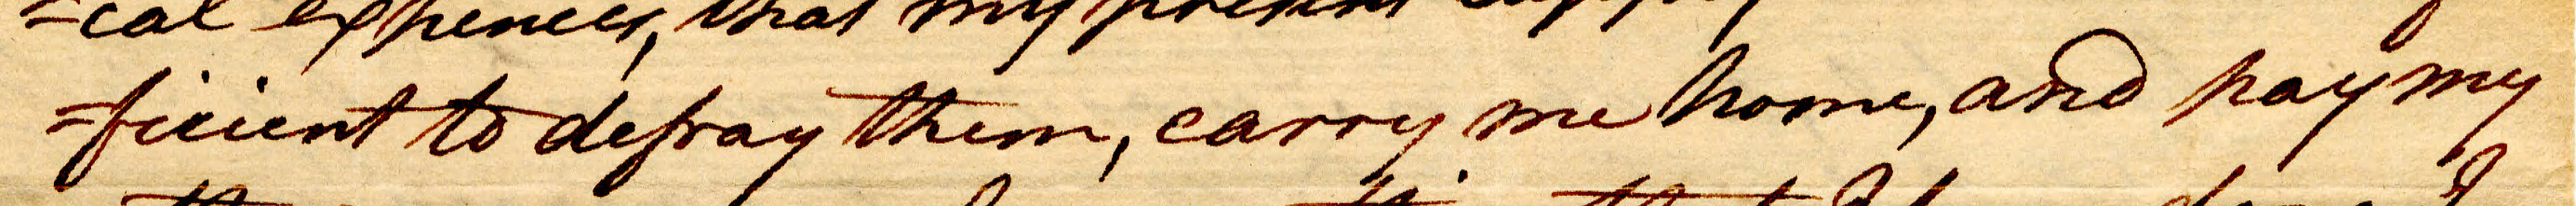-ficient to defray them, carry me home, and pay my
